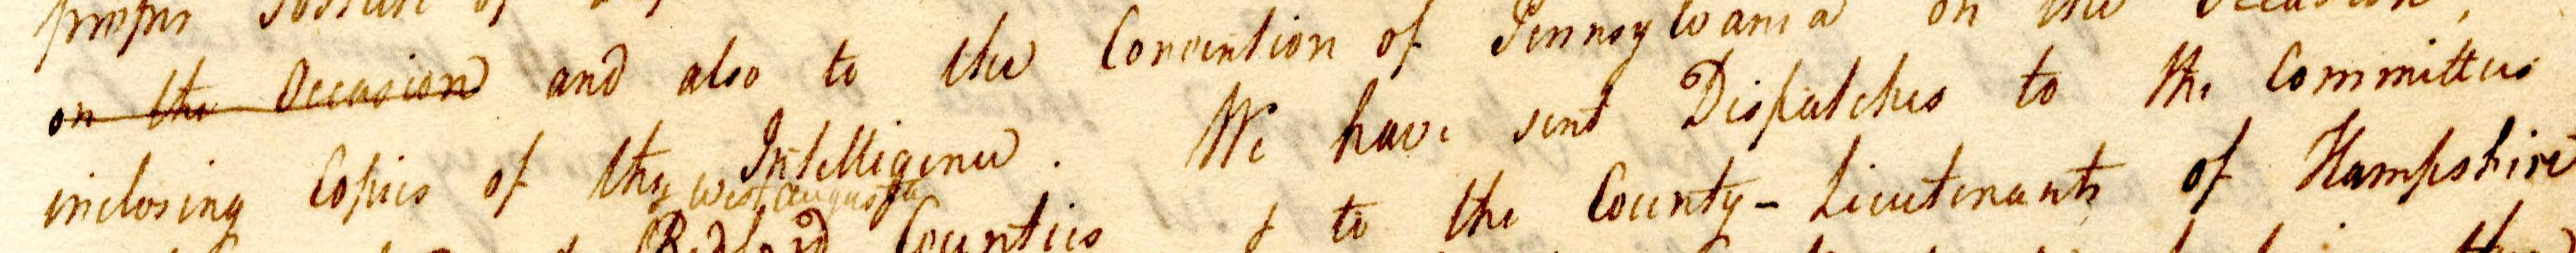inclosing Copies of the Intelligence. We have sent Dispatches to the Committees
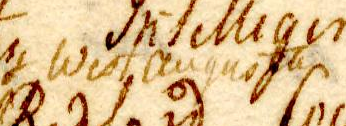& West Augusta
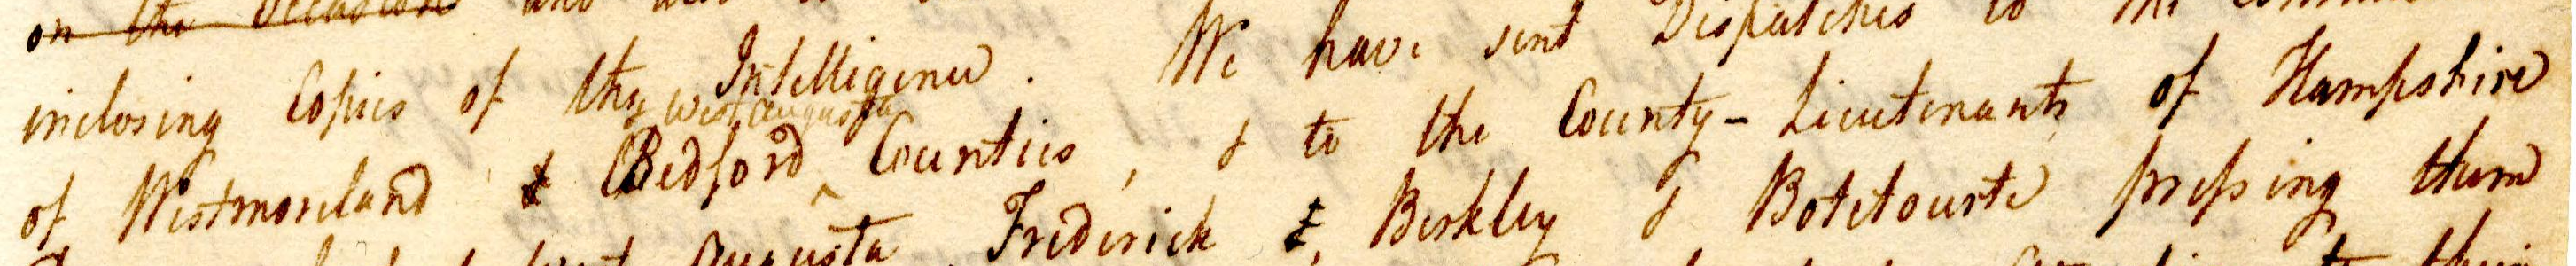of Westmoreland & Bedford ^ Counties, & to the County-Lieutenants of Hampshire
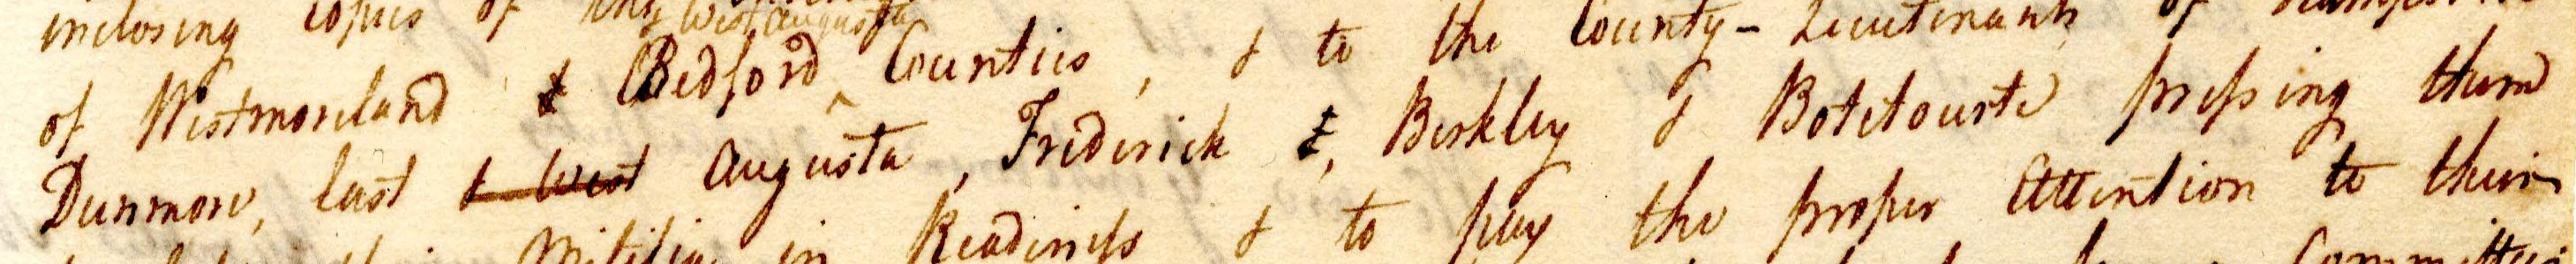Dunmore, last [& West] Augusta, Frederick & Berkley & Botetourte pressing them
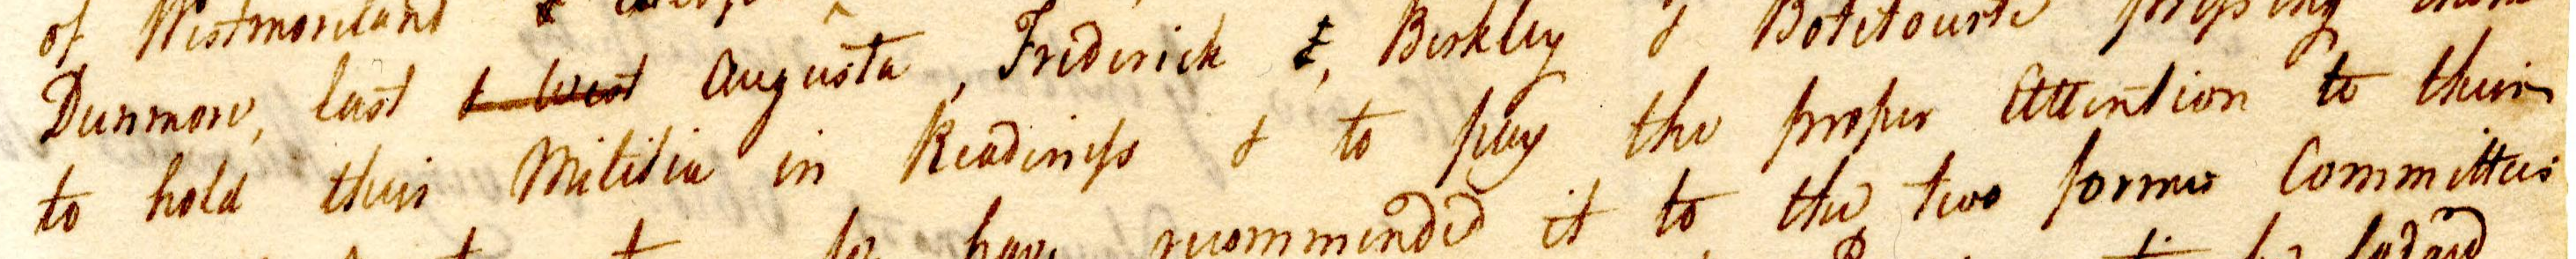to hold their Militia in Readiness & to pay the proper Attention to their
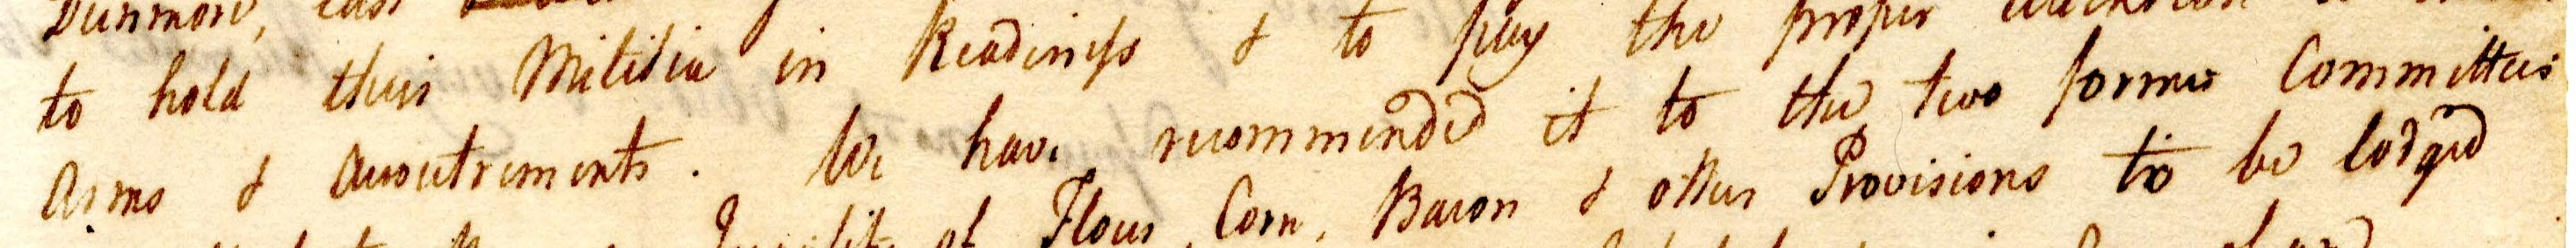Arms & accoutrements. We have recommended it to the two former Committees
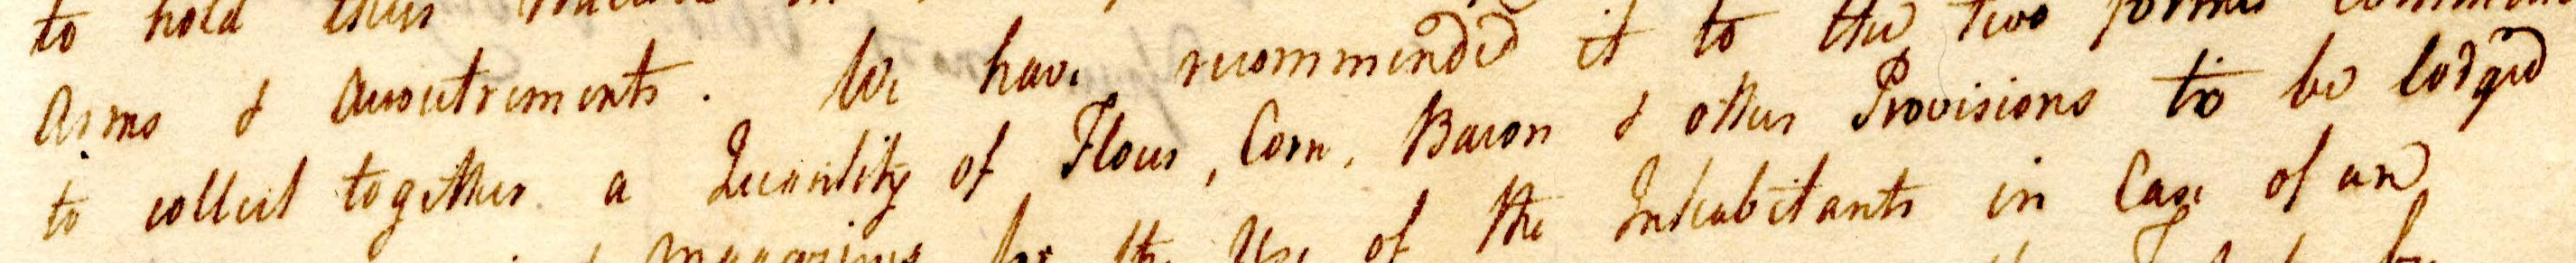to collect together a Quantity of Flour, Corn, Bacon & other Provisions to be lodged
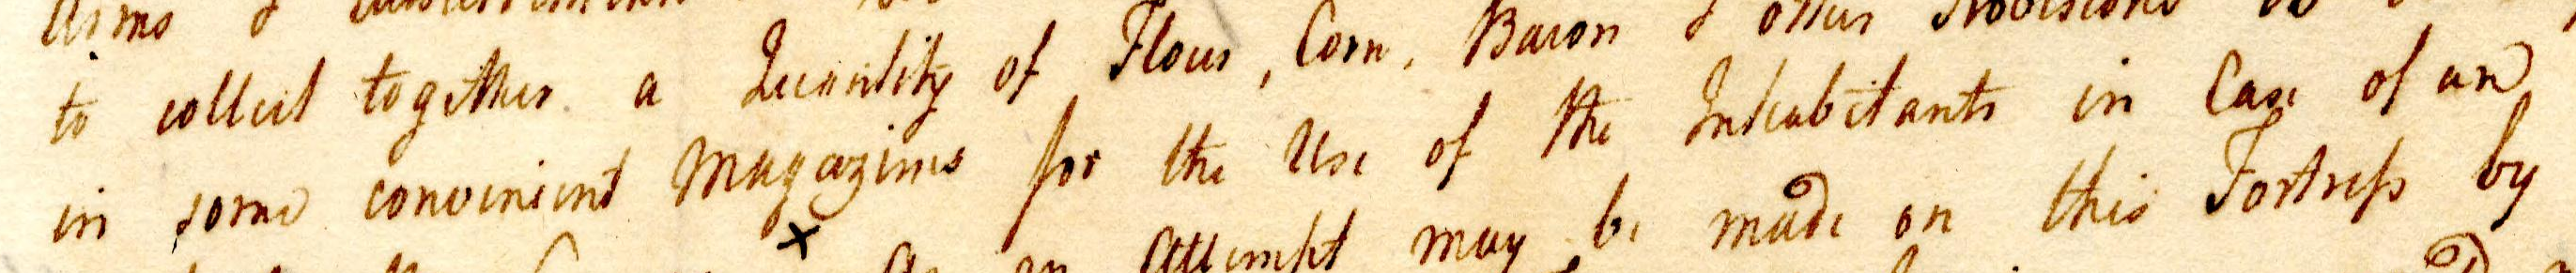in some convenient Magazines for the Use of the Inhabitants in Case of an
